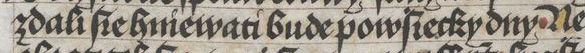zdali ſie hniewati bude powẛiecky dny.Ne¬
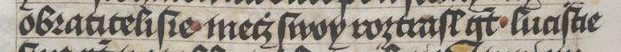obratiteli ſie.mecż ſwoy roztraſl ḡt.luciẛtie
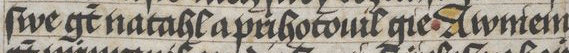ſwe ḡt natahl a pṙihotovil gie.A wniem
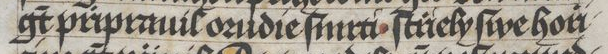ḡt pripravil ozudie ſmrti.ſtṙiely ſwe hoṙí¬
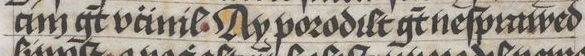cím ḡt uċinil.Ay porodilt ḡt neſprawed¬
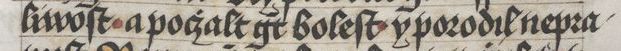liwoſt.a pocċalt ḡt boleſt.y porodil nepra¬
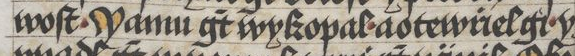woſt.Yanu ḡt wykopal.a otewṙiel gi.y
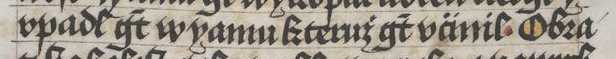upadl ḡt w yamu kteruż ḡt uċinil.Obra¬
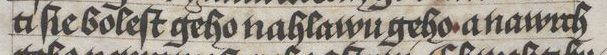ti ſie boleſt gelo nahlawu geho.a nawrch
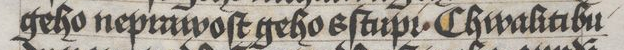geho neprawoſt geho sſtupí.Chwaliti bu¬
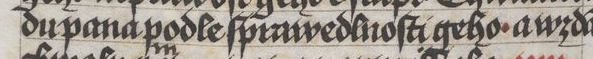du pana podle ſprawedlnoſti geho.a wzdā
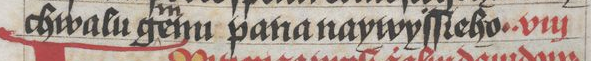chwalu gmenu pana naywyẛſieho..viij
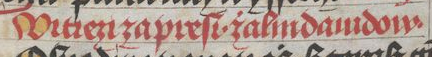Vitiezi zapreſi.żalm davidow.
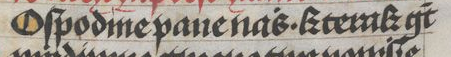Oſpodine pane naṡ.kterak ḡt
